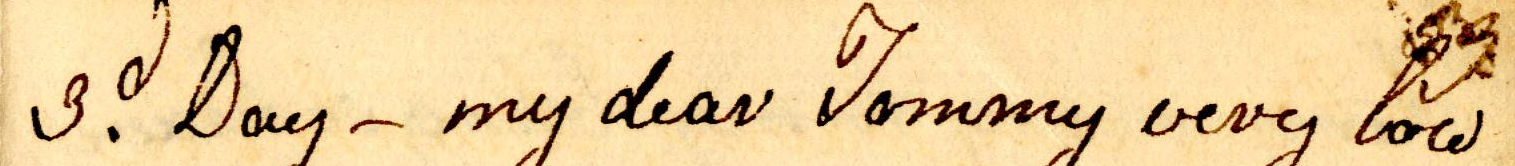3^d Day- my dear Tommy very low
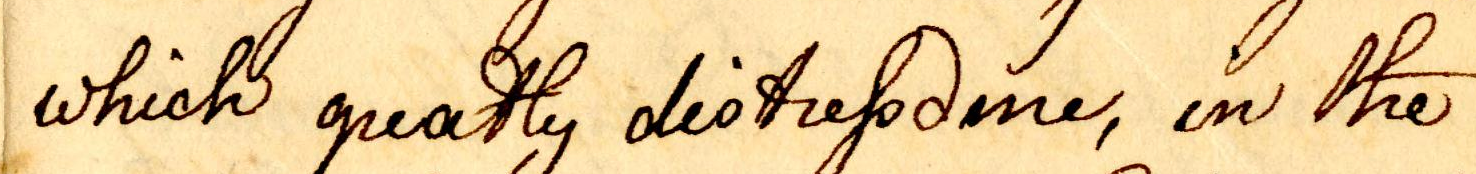which greatly distressed me, in the
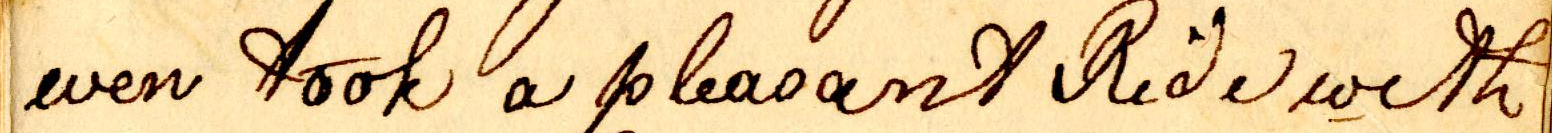even took a pleasant Ride with
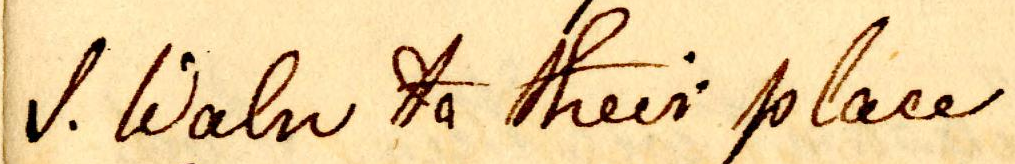S. Waln to their place
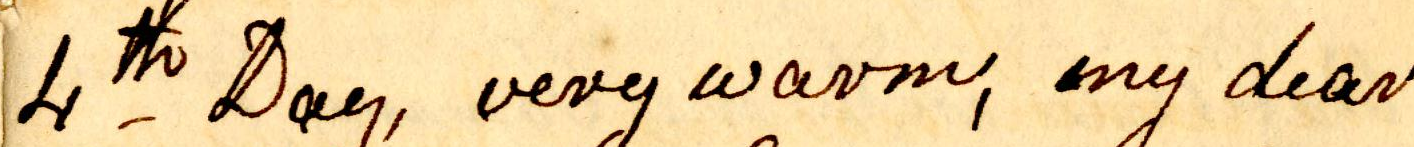4^th Day, very warm, my dear
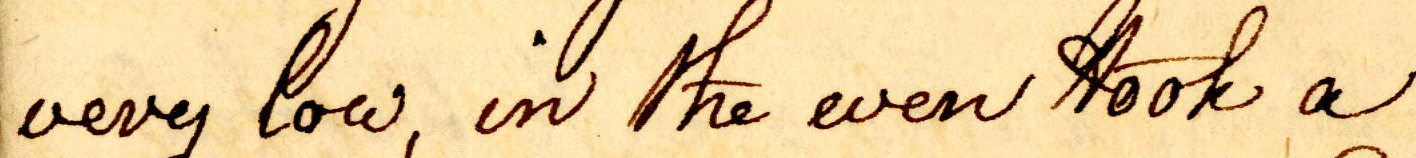very low, in the even took a
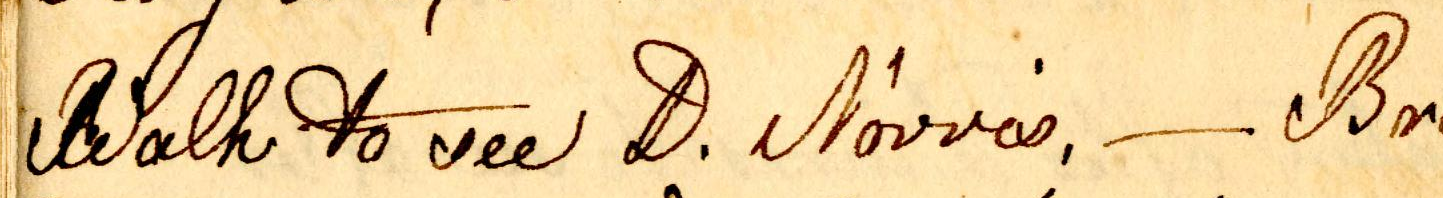Walk to see D. Norris,- Bro
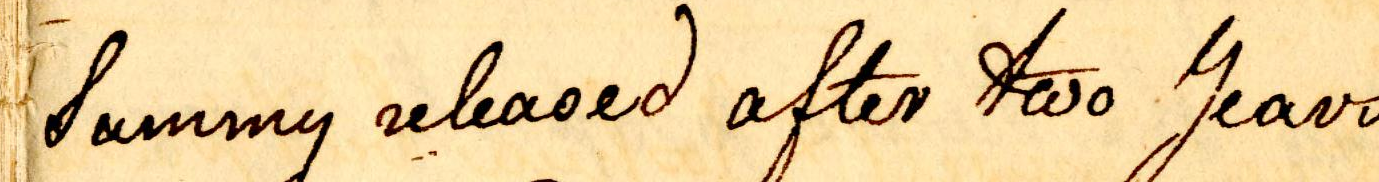Sammy released after two years
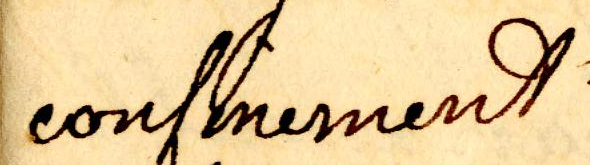confinement
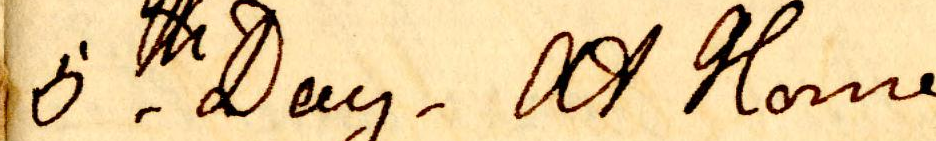5^th Day- At Home
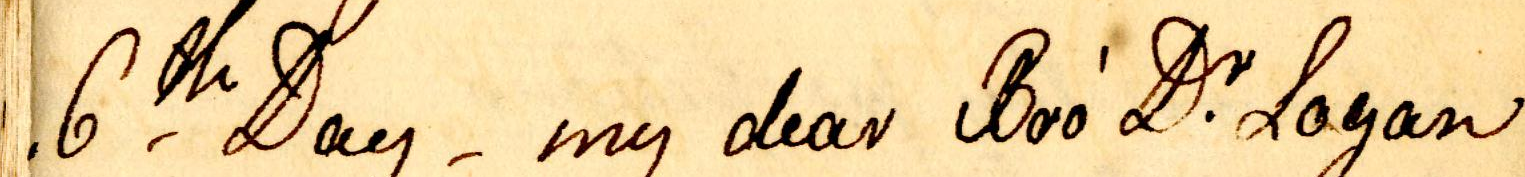6^th Day- my dear Bro' D^r. Logan
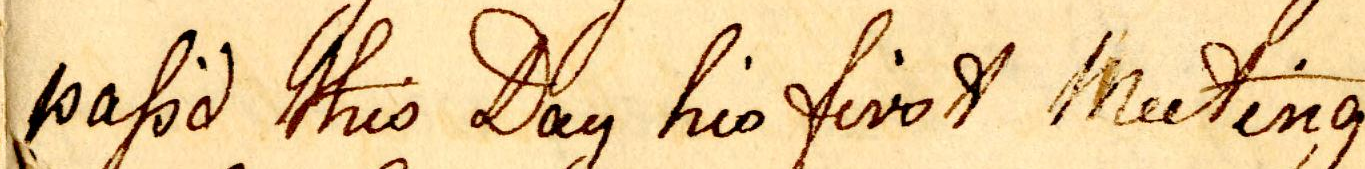pass'd this Day his first Meeting
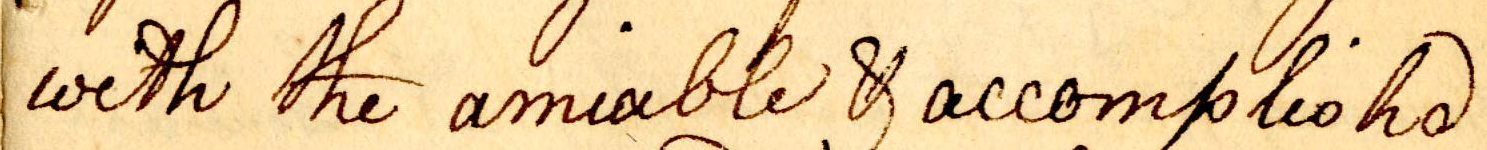with the amiable & accomplishd
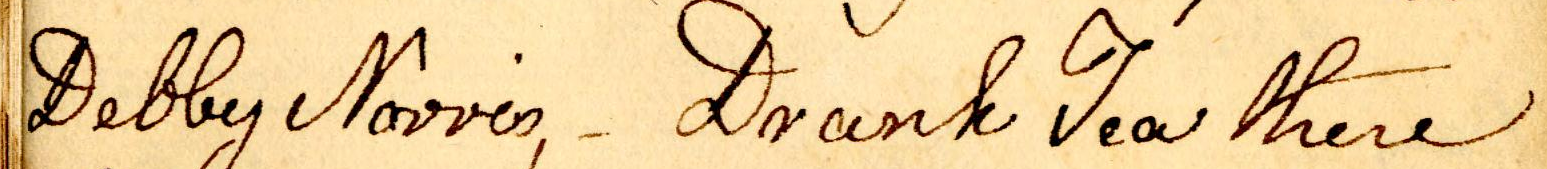Debby Norris, Drank Tea there
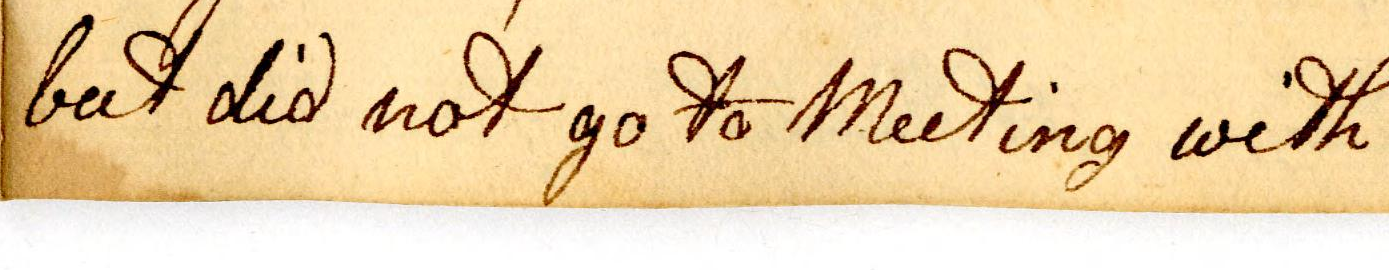but did not go to Meeting with
